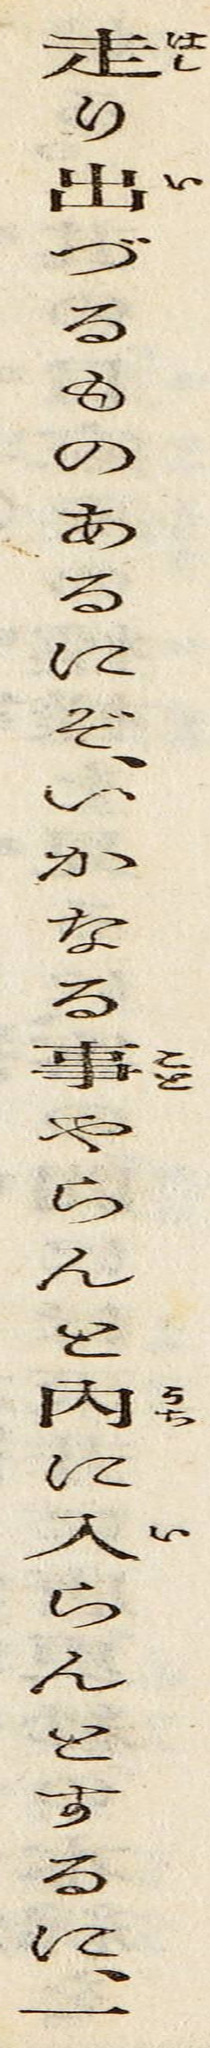走り出づるものあるにぞ、いかなる事やらんと内に入らんとするに、一
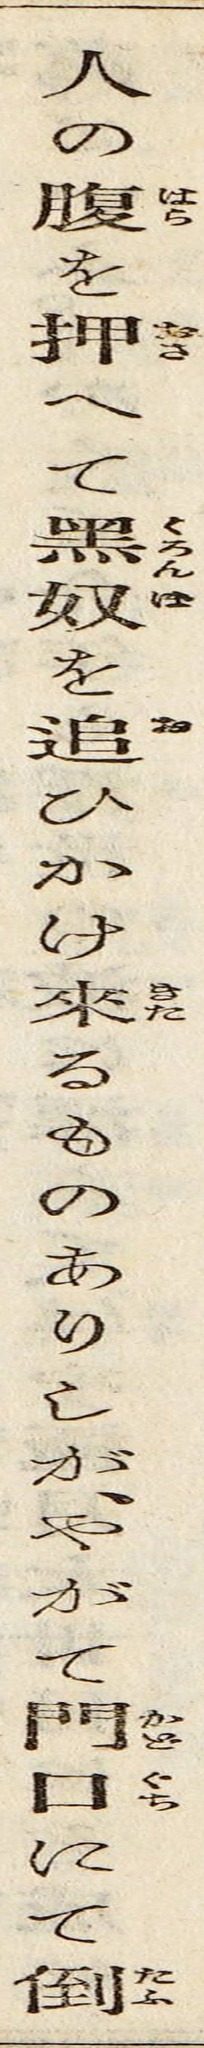人の腹を押へて黒奴を追ひかけ来るものありしが、やがて門口にて倒
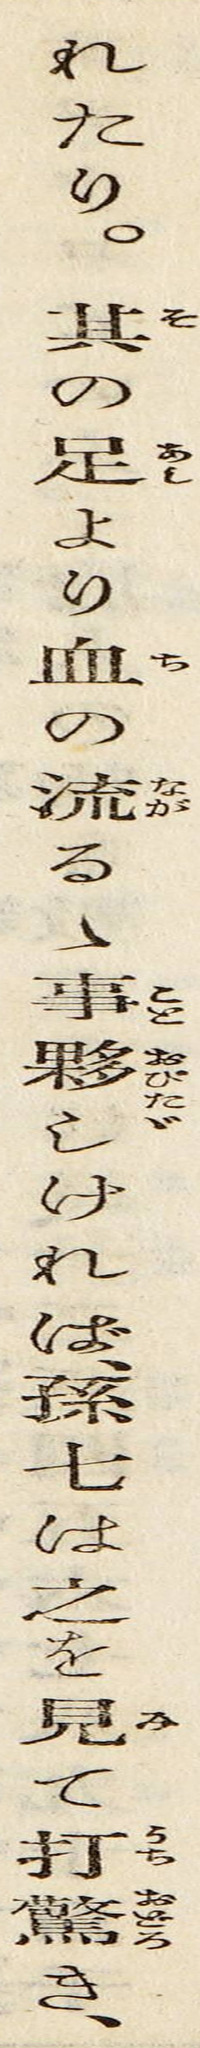れたり。其の足より血の流るゝ事夥しければ、孫七は之を見て打驚き、
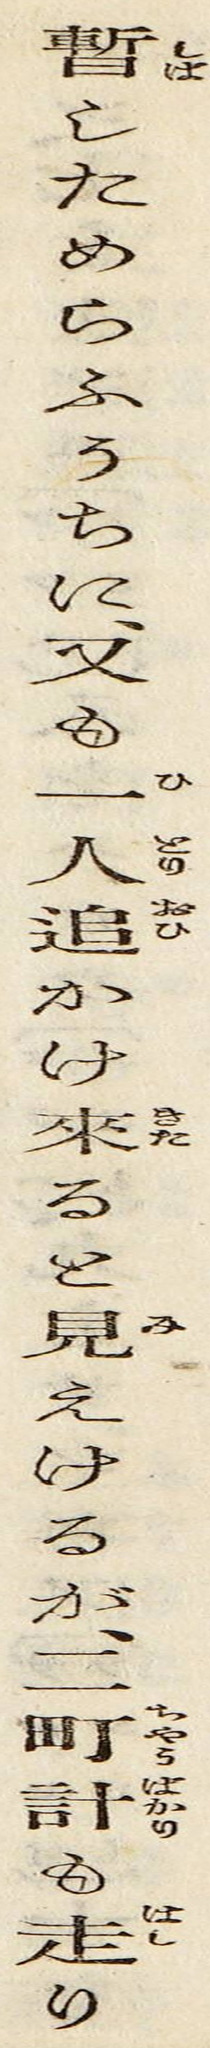暫しためらふうちに、又も一人追かけ来ると見えけるが、二町計も走り
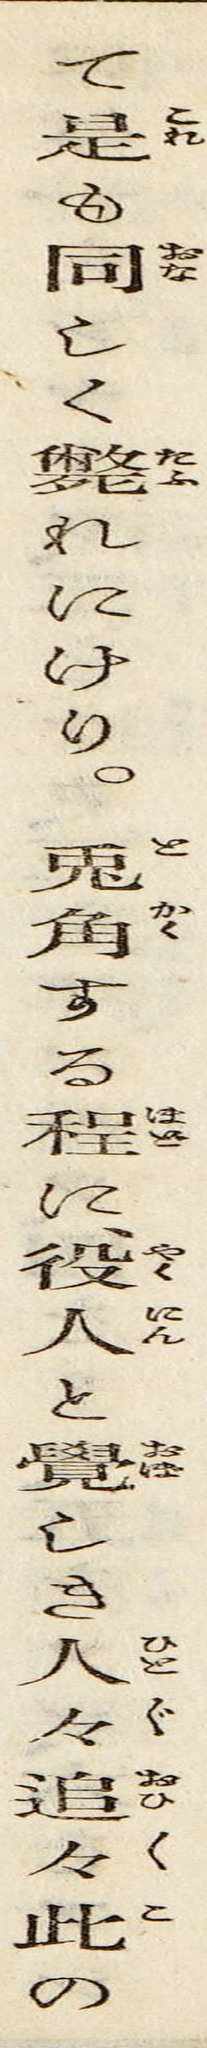て是も同しく斃れにけり。兎角する程に、役人と覚しき人々追々此の
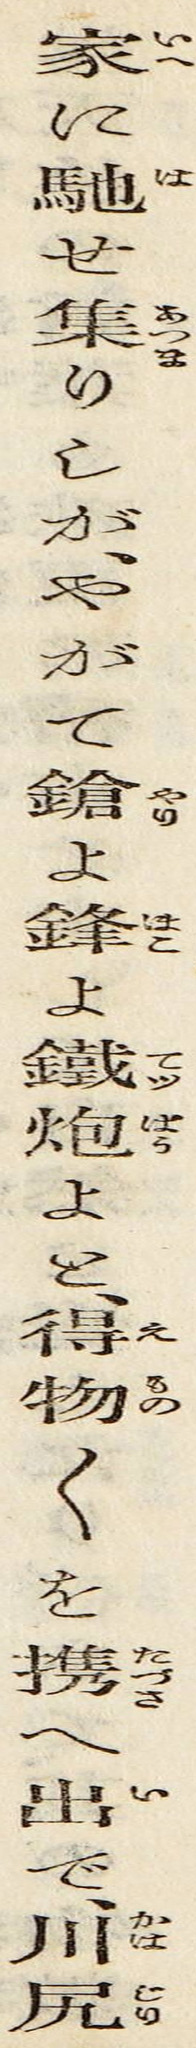家に馳せ集りしが、やがて鎗よ鉾よ鉄炮よと、得物〳〵を携へ出で、川尻
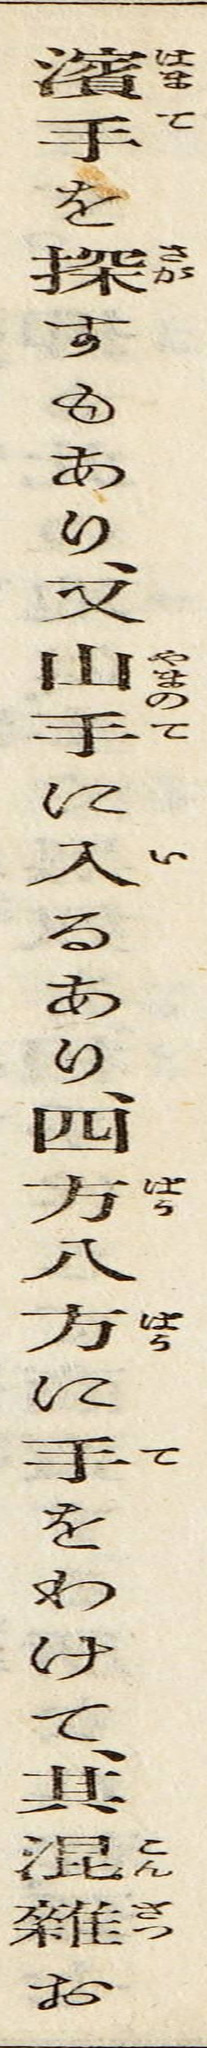浜手を探すもあり、又山手に入るあり、四方八方に手をわけて、其混雑お
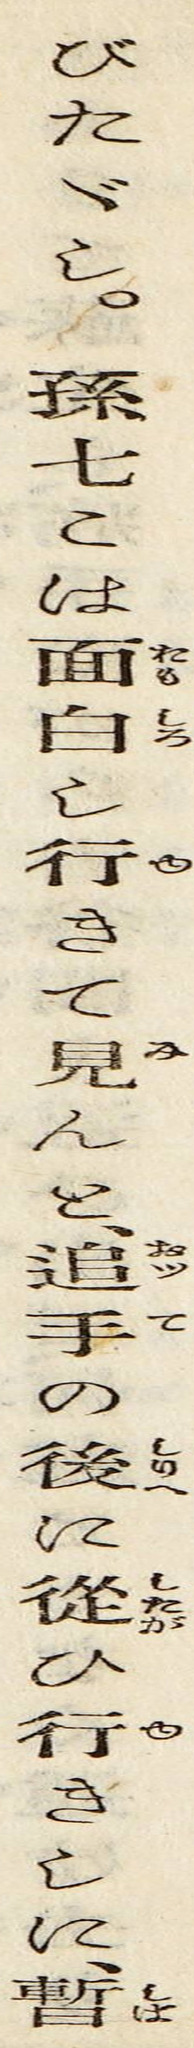びたヾし。孫七こは面白し行きて見んと、追手の後に従ひ行きしに、暫
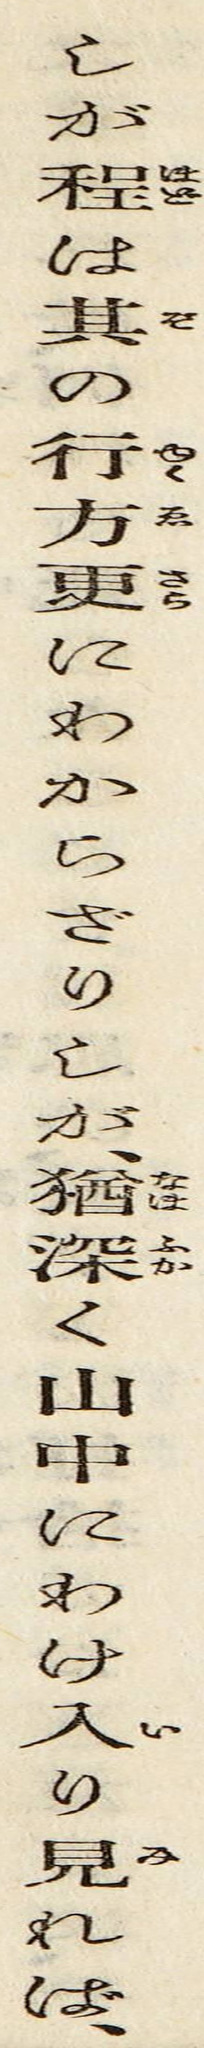しが程は其の行方更にわからざりしが、猶深く山中にわけ入り見れば、
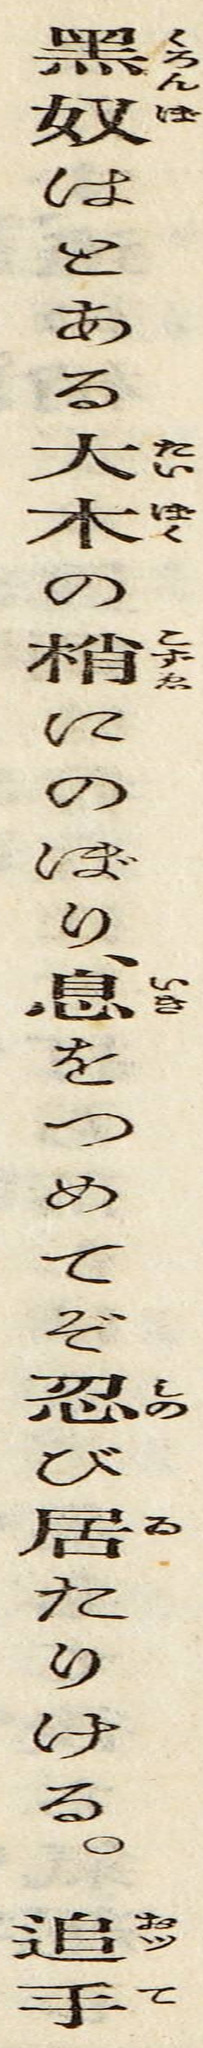黒奴はとある大木の梢にのぼり、息をつめてぞ忍び居たりける。追手
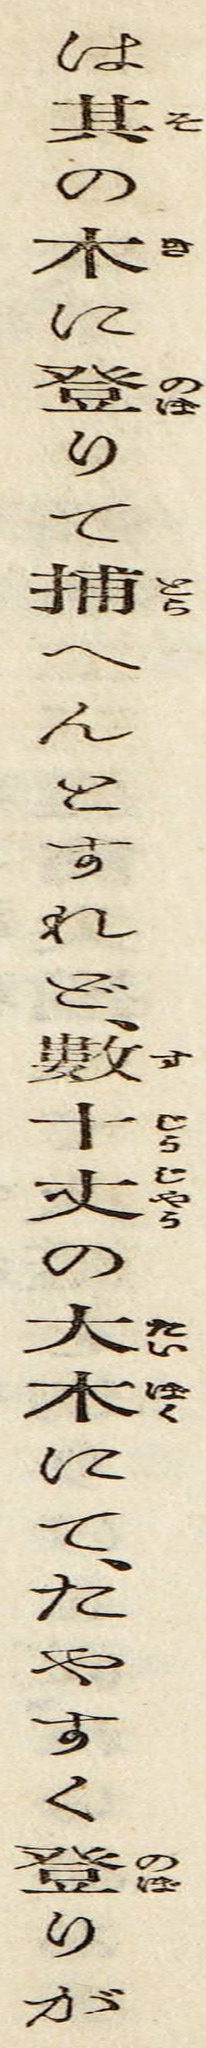は其の木に登りて捕へんとすれど、数十丈の大木にて、たやすく登りが

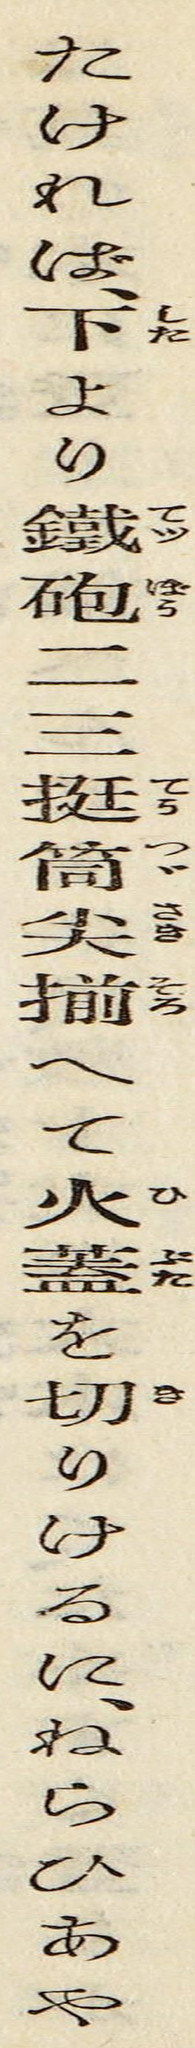たければ、下より鉄砲二三挺筒尖揃へて火蓋を切りけるに、ねらひあや
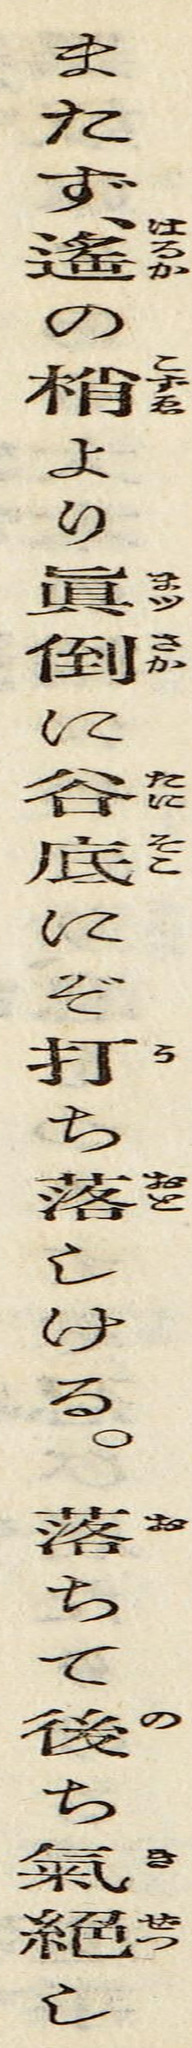またず、遥の梢より真倒に谷底にぞ打ち落しける。落ちて後ち気絶し
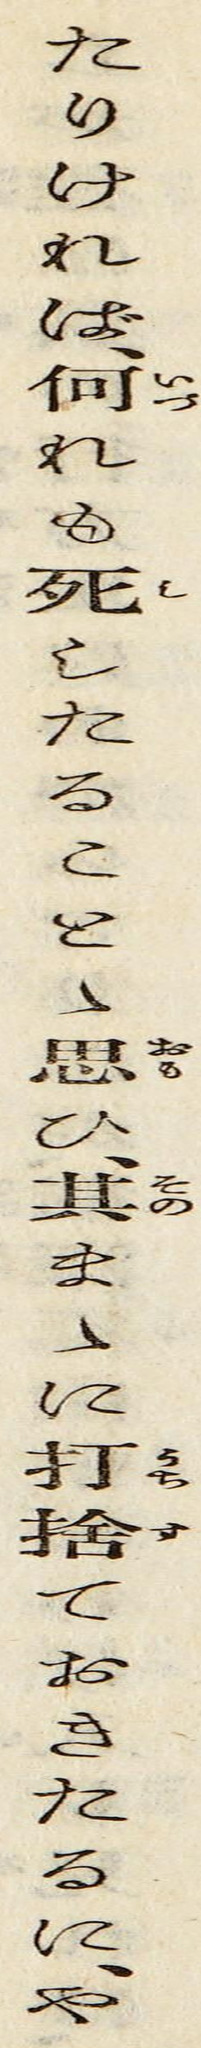たりければ、何れも死したることゝ思ひ、其まゝに打捨ておきたるに、や
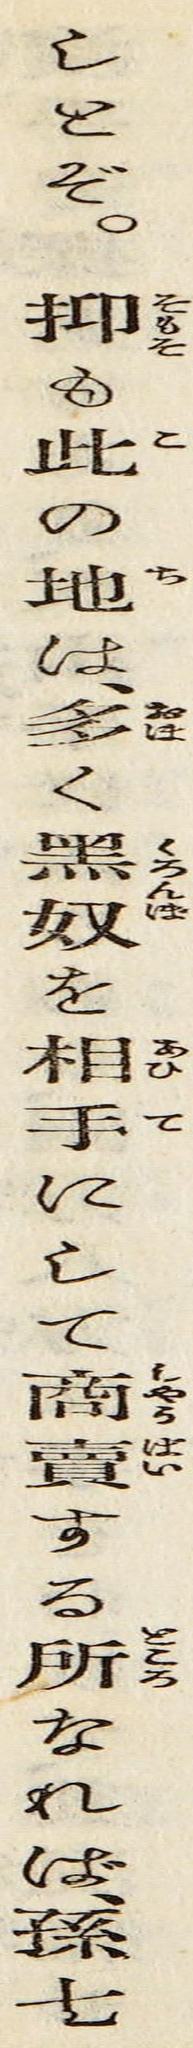しとぞ。抑も此の地は、多く黒奴を相手にして商売する所なれば、孫七
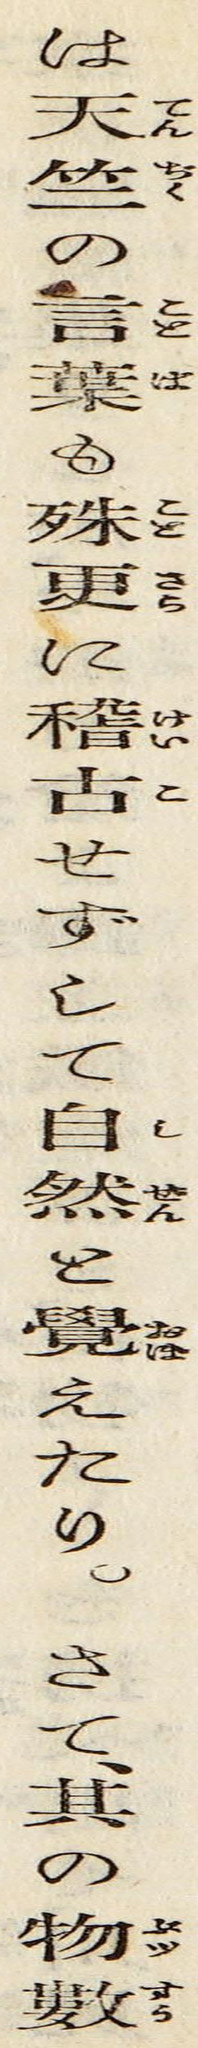は天竺の言葉も殊更に稽古せずして自然と覚えたり。さて、其の物数
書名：日本漂流譚
